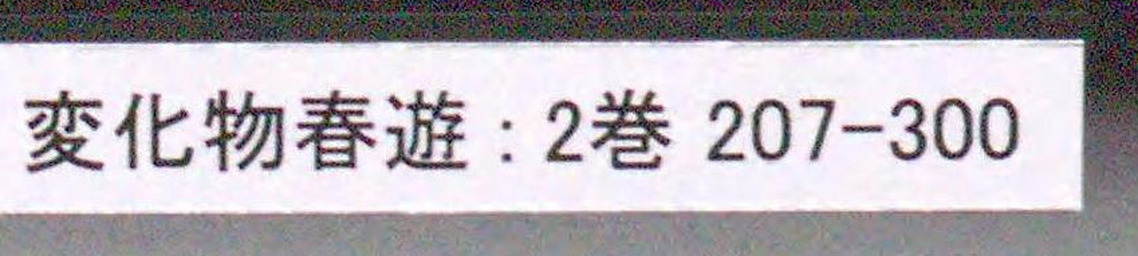変化物春遊
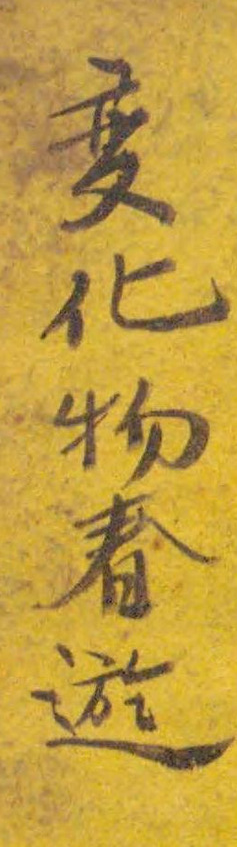変化物春遊

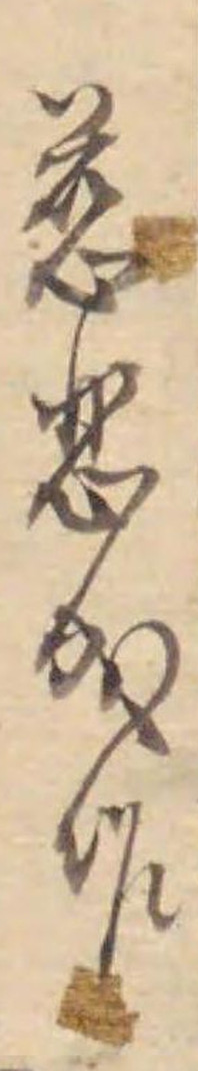慈悲成作
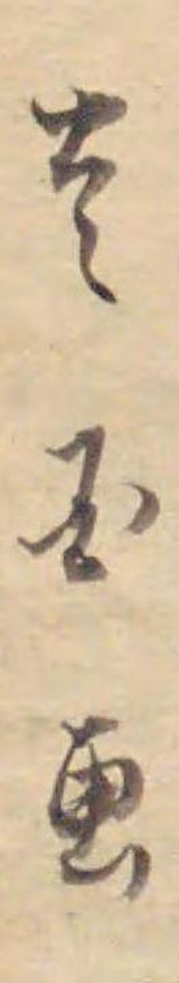豊国画

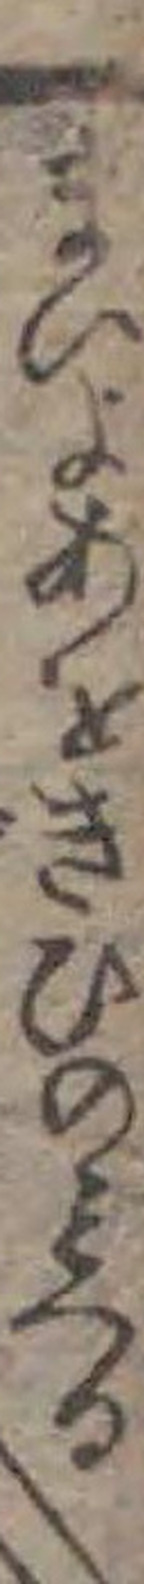まいよあをきひのみへる
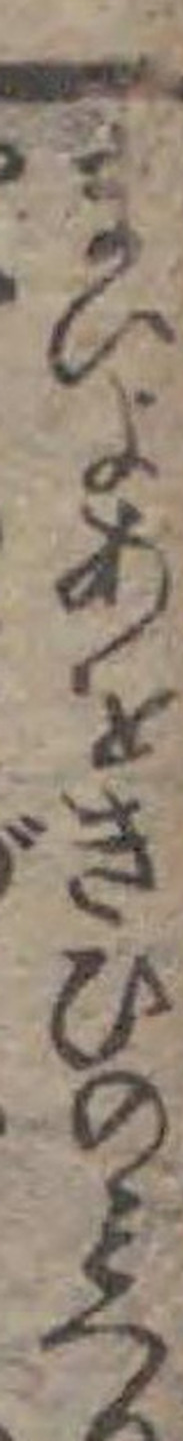まいよあをきひのみへる
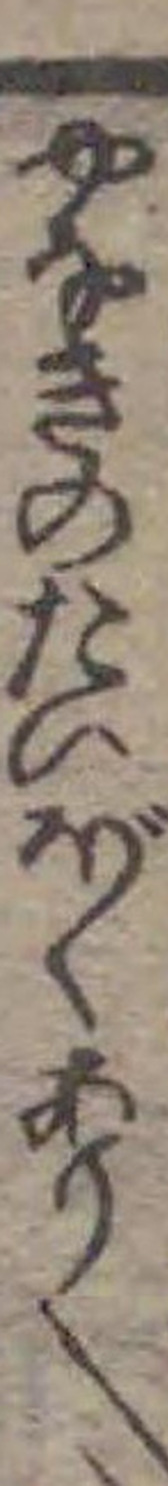やなきのたいぼくあり
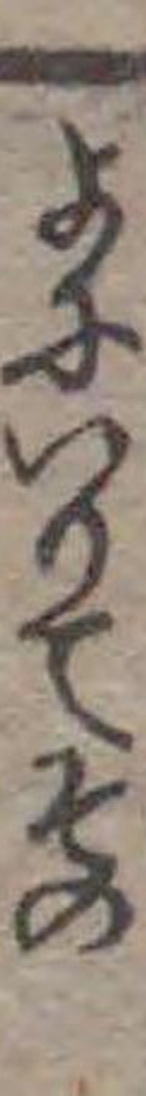よにいりてその
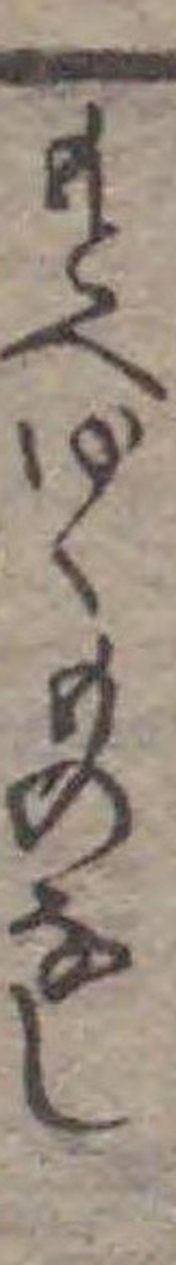もとへゆくものなし
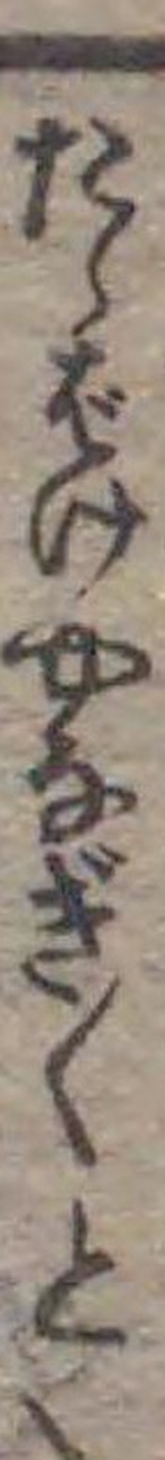たゝばけやなぎ〳〵と
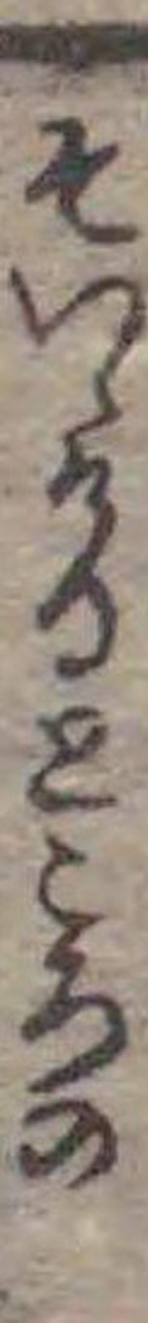そいゝけるところの
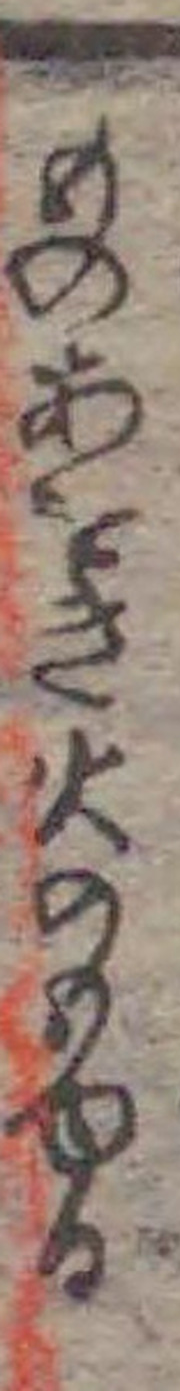ものあをき火のもゆる
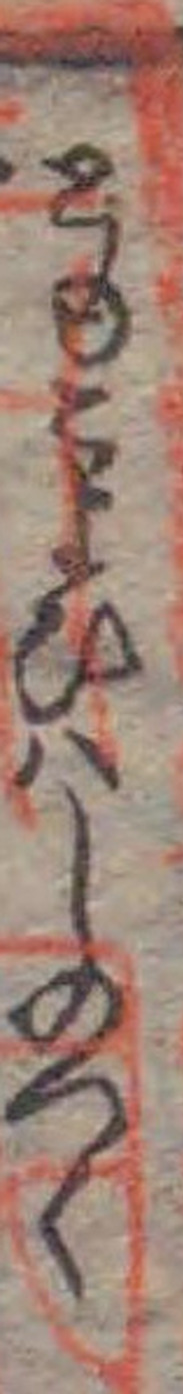ともこよひはしのつく
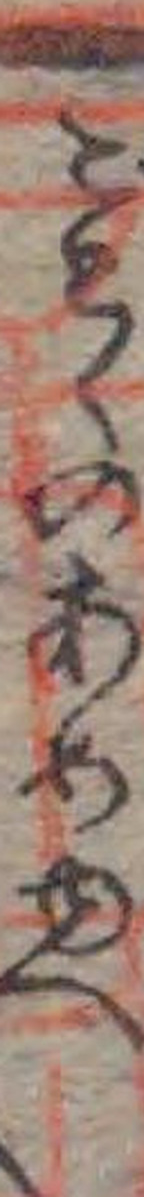ごとくのあめゆへ
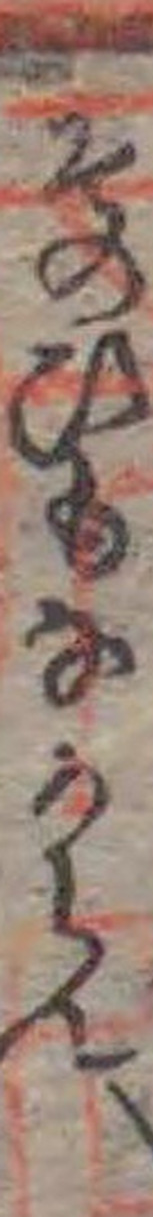そのひもなからん
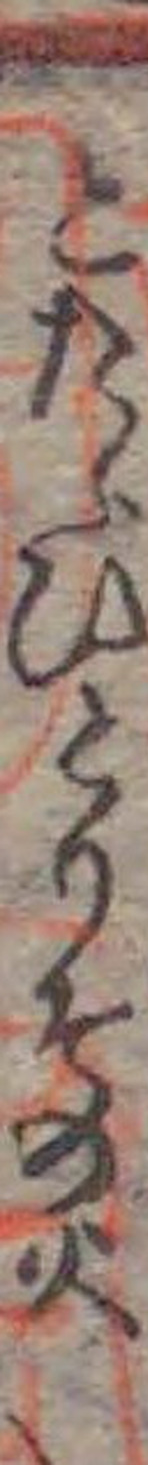とたゞひとりその火
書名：変化物春遊 : 2巻
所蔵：国立国会図書館 National Diet Library, JAPAN
